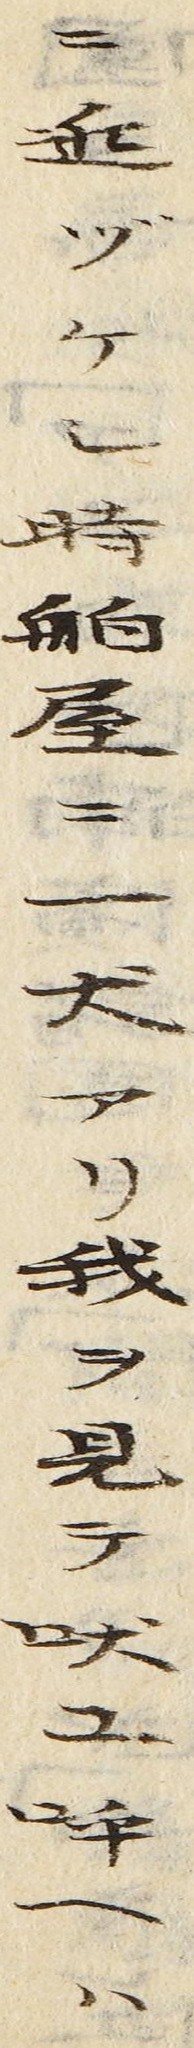ニ近ヅケシ時舶屋ニ一犬アリ我ヲ見テ吠ユ呼ヘハ
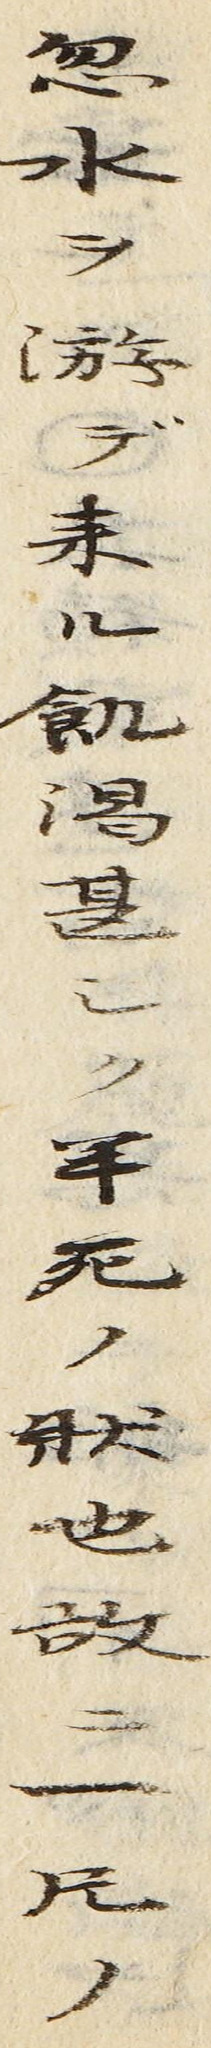忽水ヲ游デ来ル飢渇甚シク半死ノ状也故ニ一片ノ
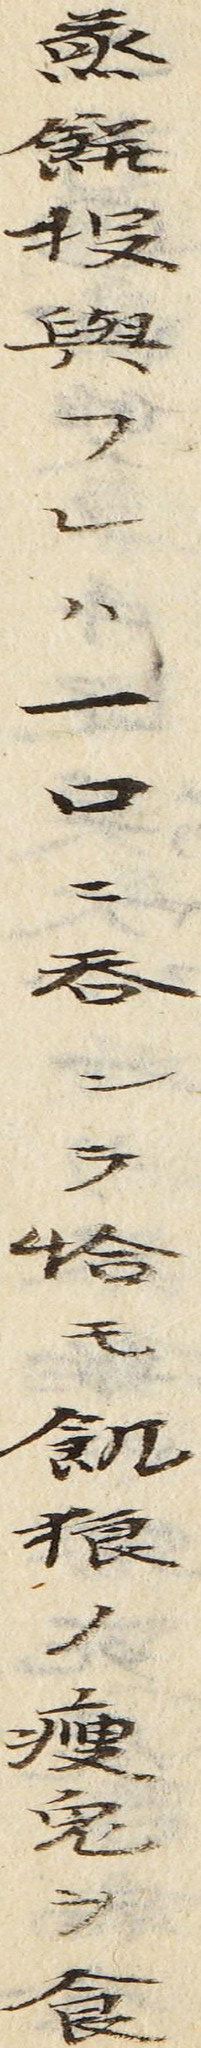蒸餅投与フレハ一口ニ呑ンテ恰モ飢狼ノ痩兎ヲ食
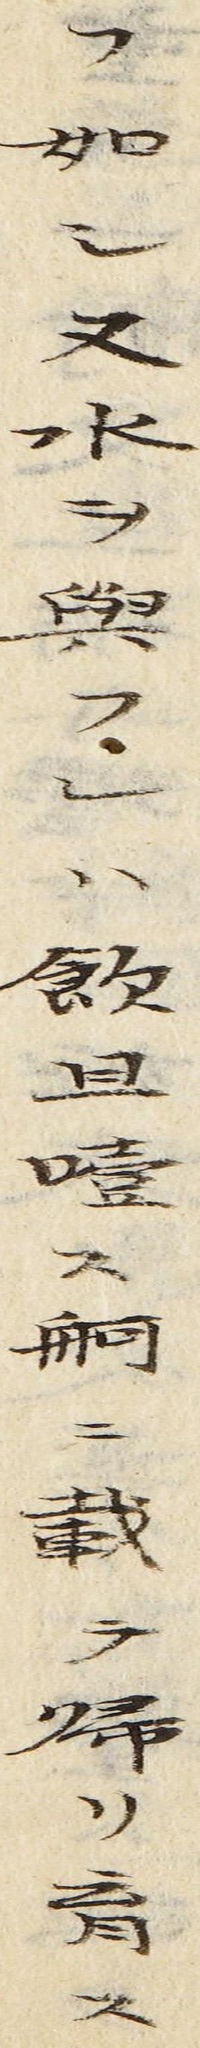フ如シ又水ヲ与フレハ飲且噎ス舸ニ載テ帰リ育ス
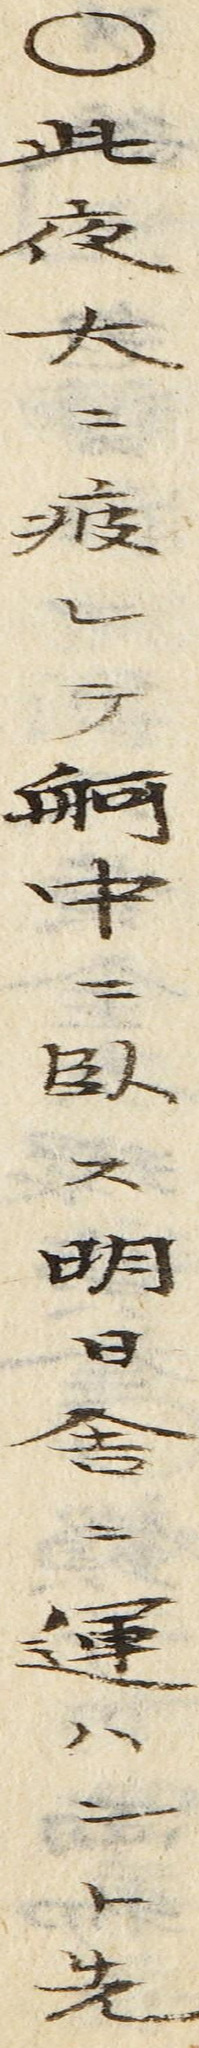◯此夜大ニ疲レテ舸中ニ臥ス明日舎ニ運ハント先
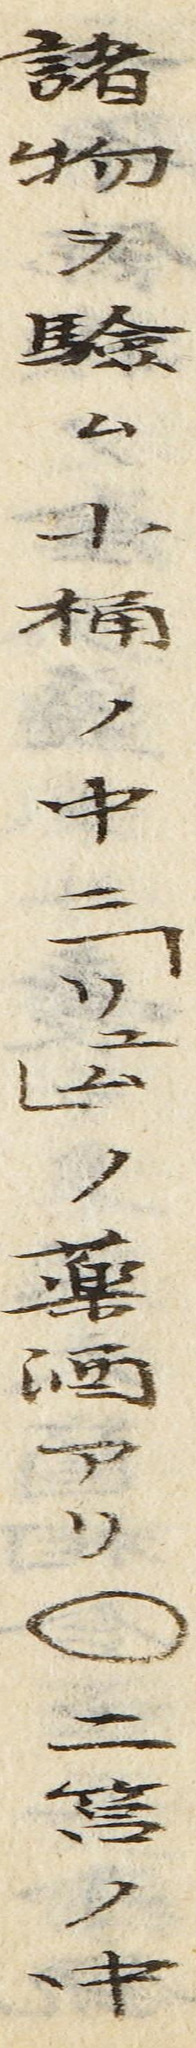諸物ヲ験ム小桶ノ中ニ「リュム」ノ薬酒アリ◯二筥ノ中
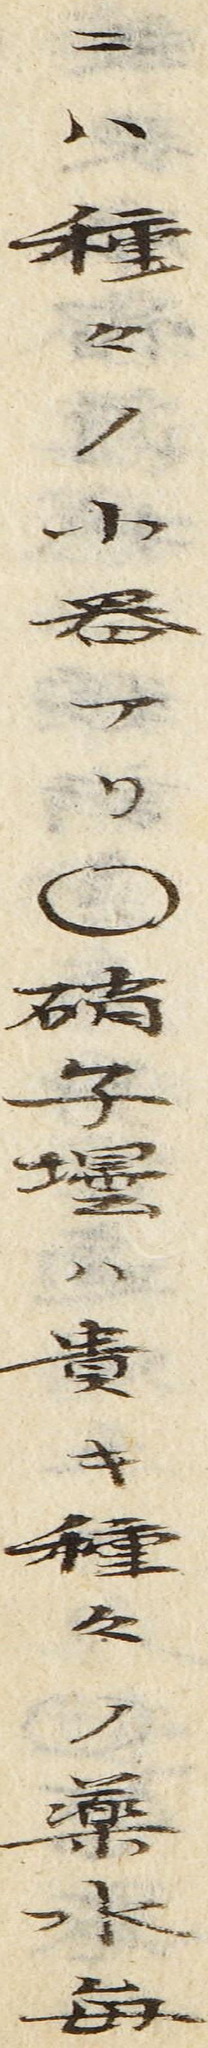ニハ種々ノ小器アリ◯硝子壜ハ貴キ種々ノ薬水毎
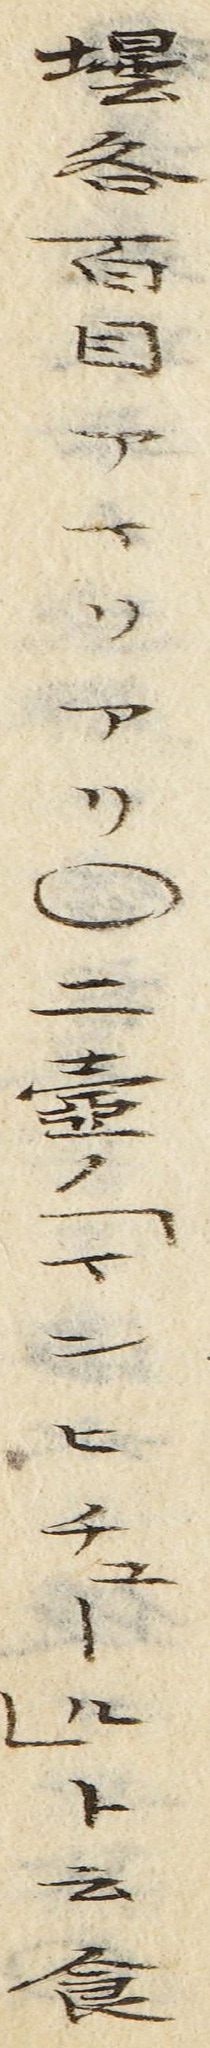壜各百目アマリアリ◯二壺ノ「マンヒチュール」ト云食

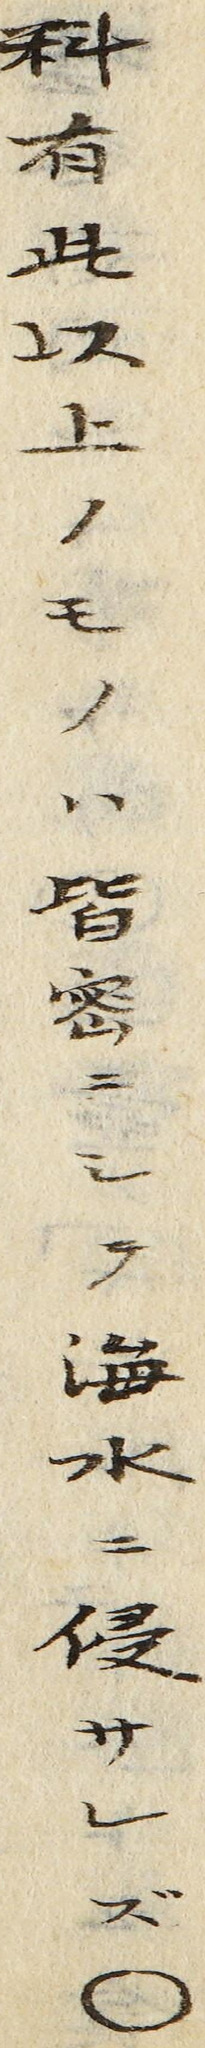料有此以上ノモノハ皆密ニシテ海水ニ侵サレズ◯
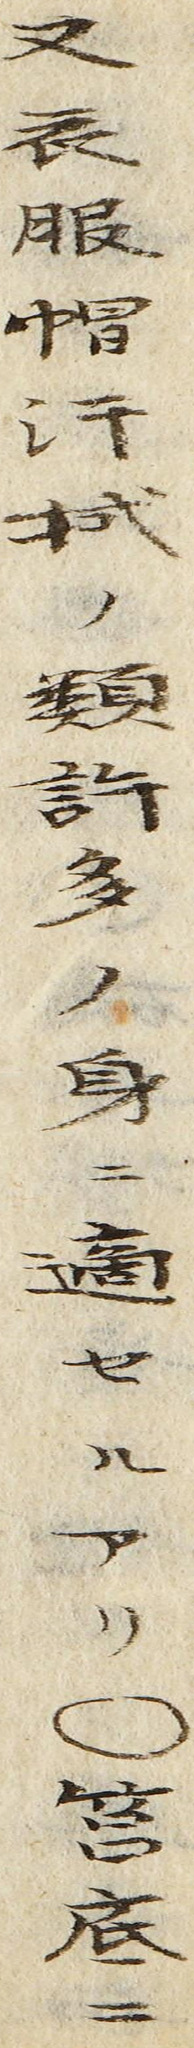又衣服帽汗拭ノ類許多ノ身ニ適セルアリ◯筥底ニ
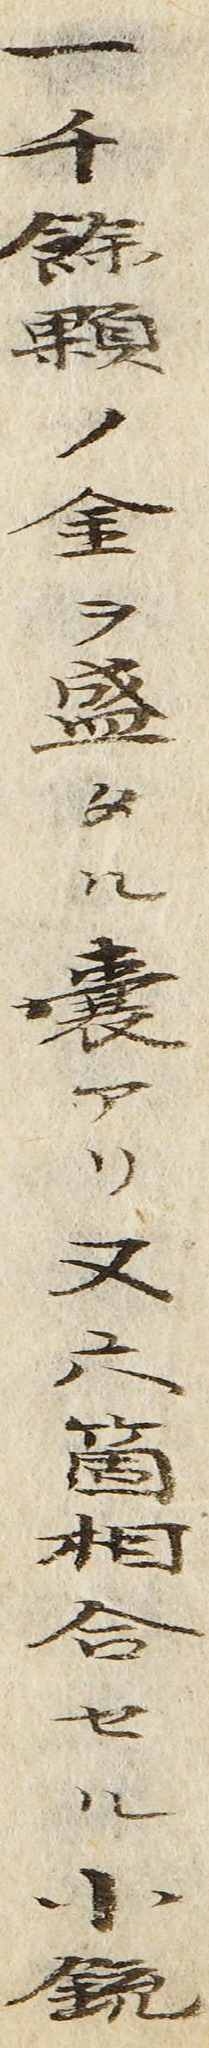一千余顆ノ金ヲ盛タル嚢アリ又六箇相合セル小銃
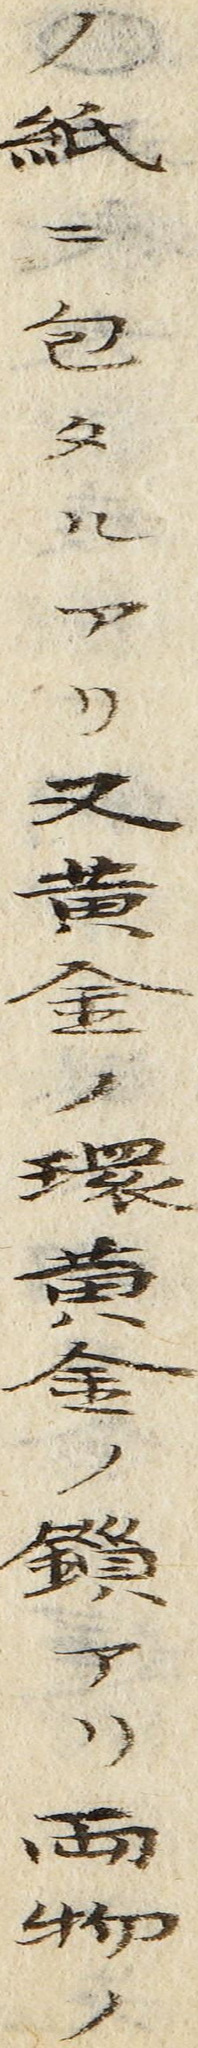ノ紙ニ包タルアリ又黄金ノ環黄金ノ鎖アリ両物ノ
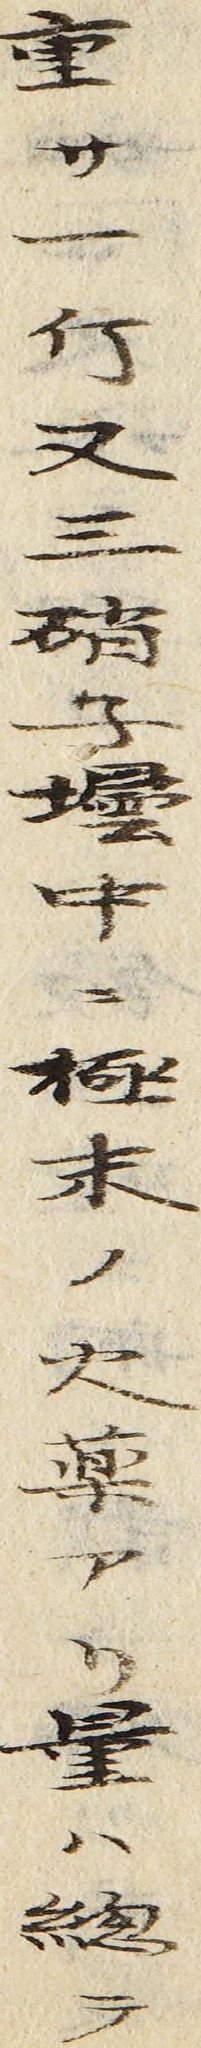重サ一斤又三硝子壜中ニ極末ノ火薬アリ量ハ総テ
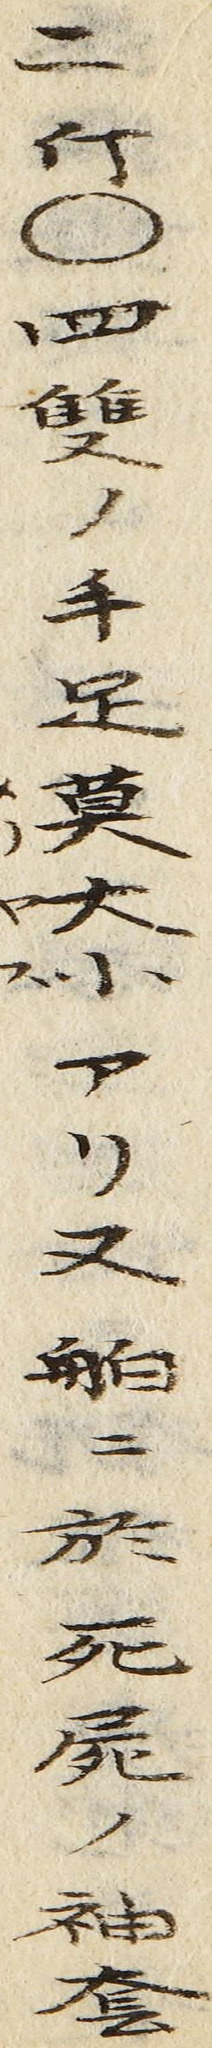二斤◯四双ノ手足莫大小アリ又舶ニ於死屍ノ袖套
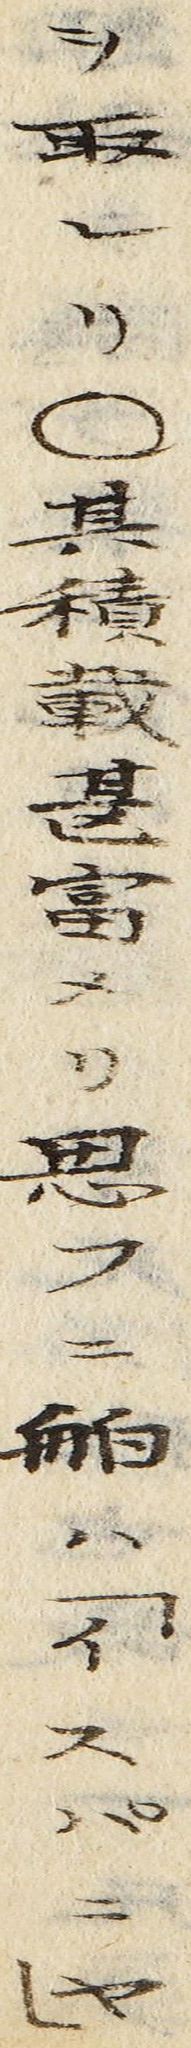ヲ取レリ◯其積載甚富メリ思フニ舶ハ「イスパニヤ」
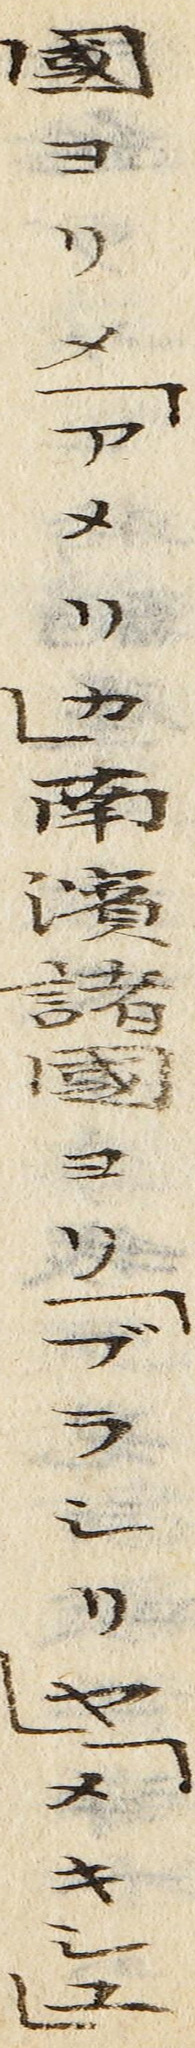国ヨリシテ「アメリカ」南浜諸国ヨリ「ブラシリヤ」「メキシユ」
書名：漂流紀事
